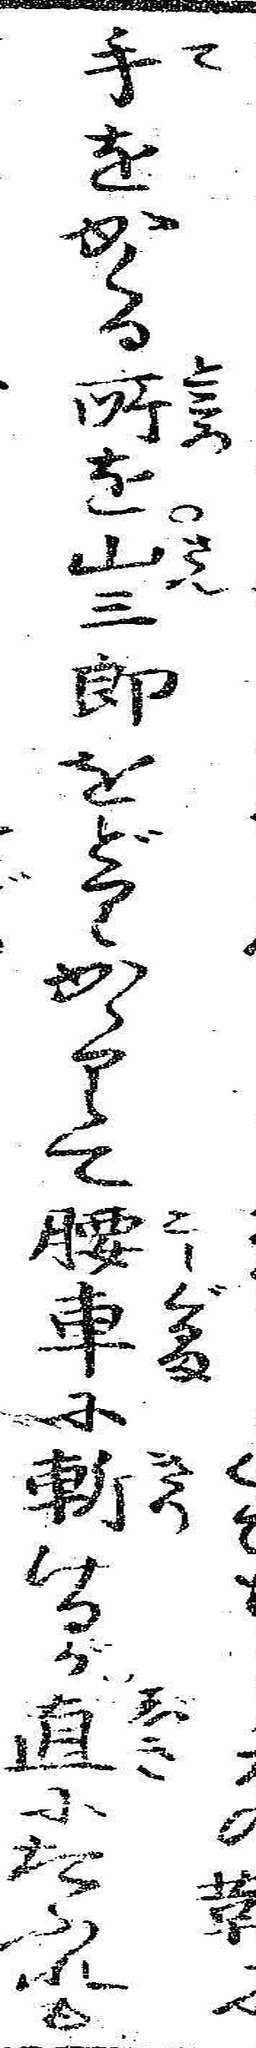手をかくる所を。山三郎をどりかゝりて腰車に斬けるが。直にたふれも
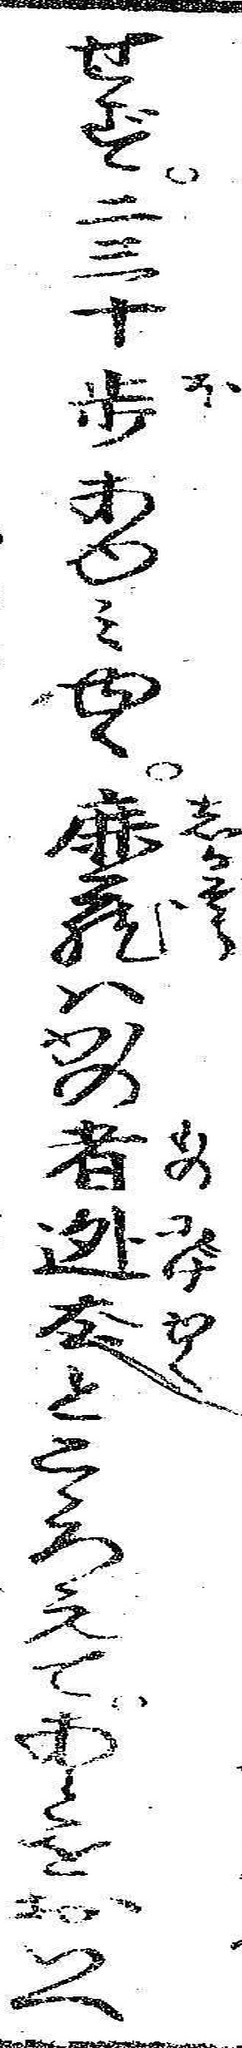せず。二三十歩あゆみゆく。鹿蔵はかの者逃去とこゝろえて。あとをおいへ
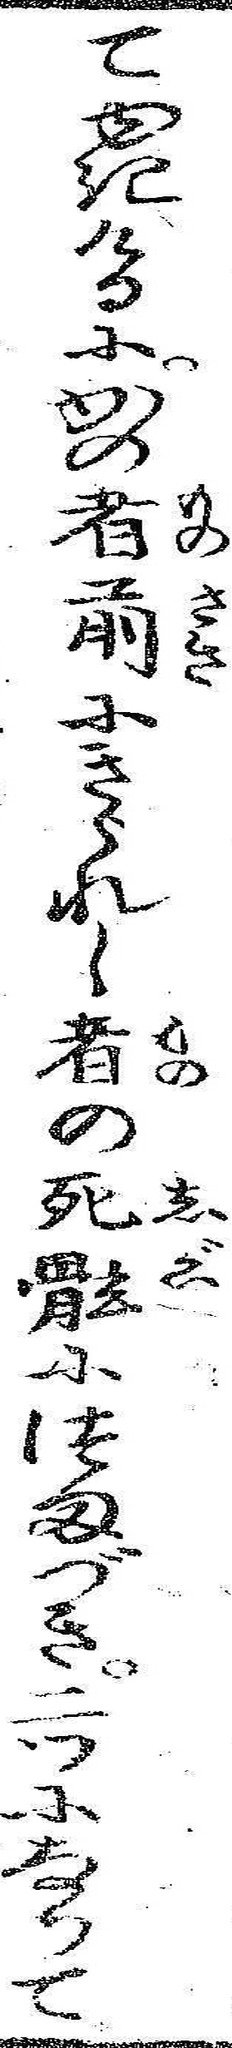てゆきけるに。かの者前にきられし者の死骸につまづき。二ツになりて
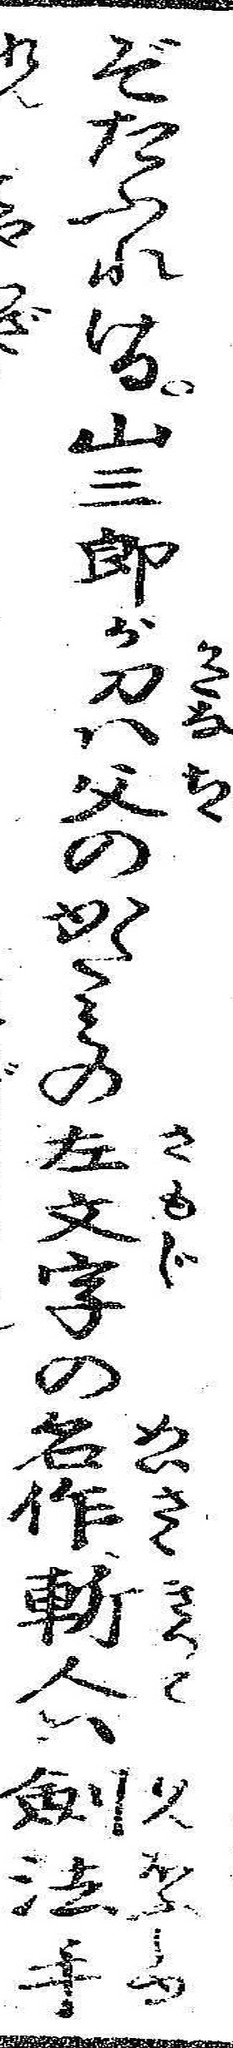ぞたふれける。山三郎が刀は父のかたみの左文字の名作斬人は剣法手
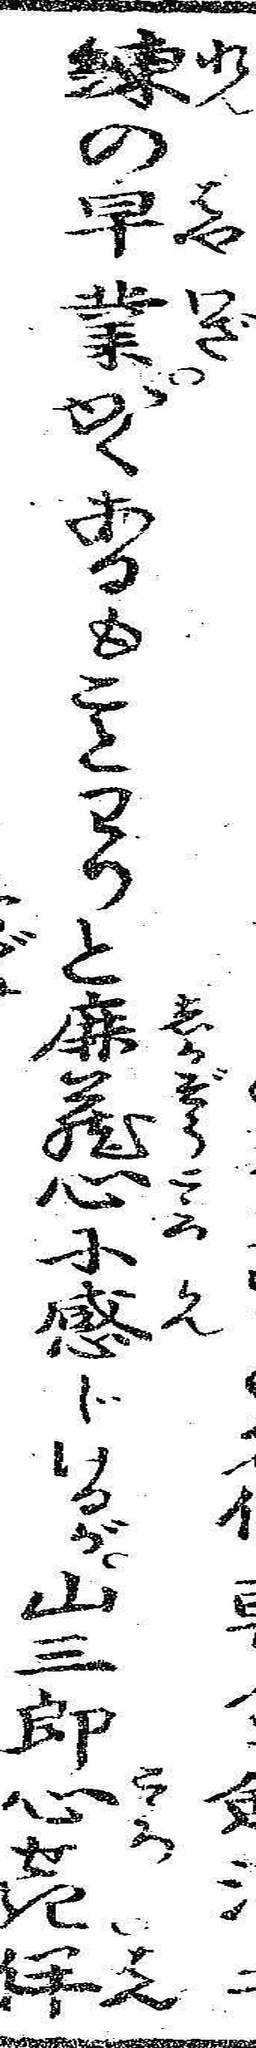練の早業。かくあるもことわりと鹿蔵心に感じけるが。山三郎心せき。伴
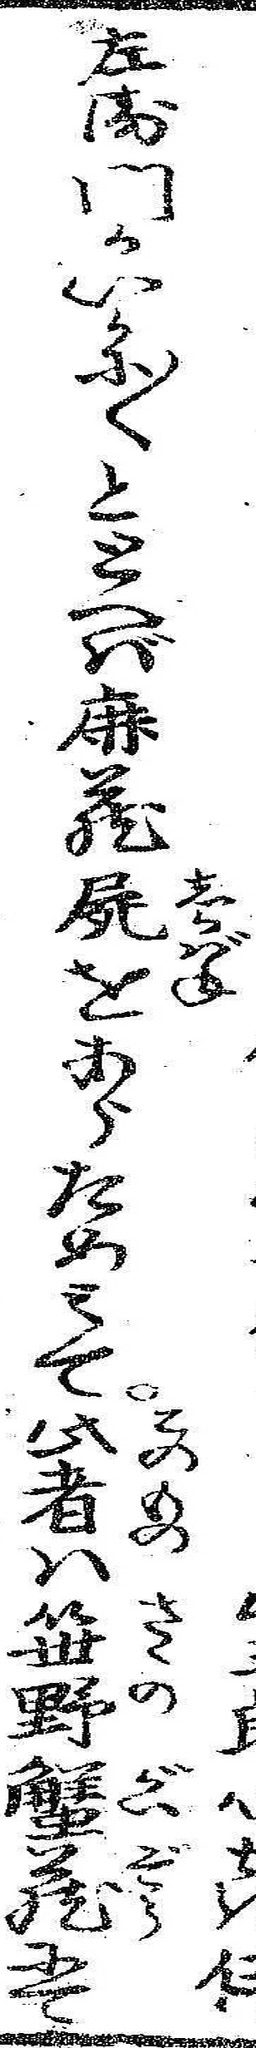左衛門かいかに〳〵ととへば鹿蔵屍をあらためみて。此者は笹野蟹蔵にて
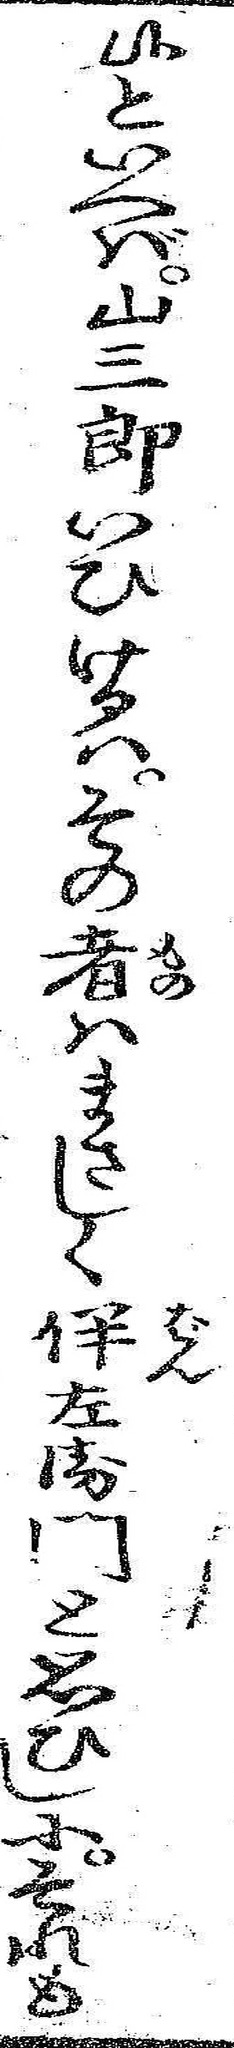候といへば。山三郎いひけるは。その者はまさしく伴左衛門と思ひしに。それも
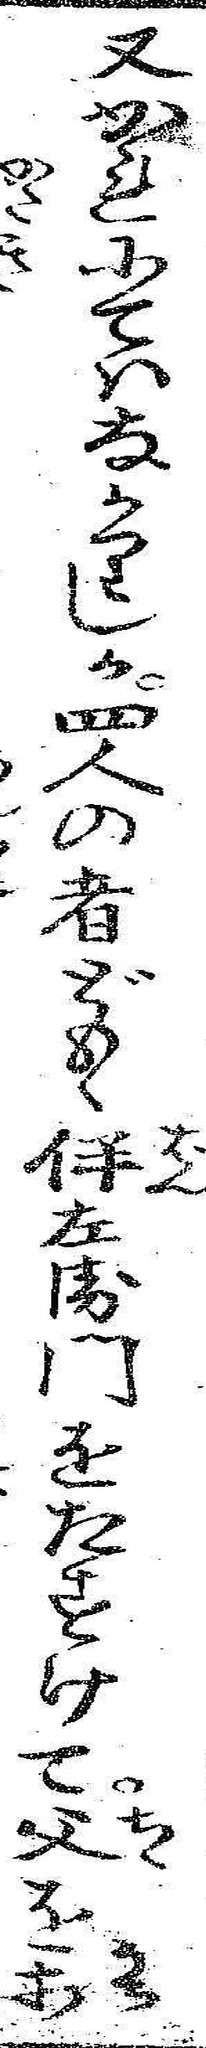又かれにてはなかりしか。四人の者どもゝ伴左衛門をたすけて。父を打
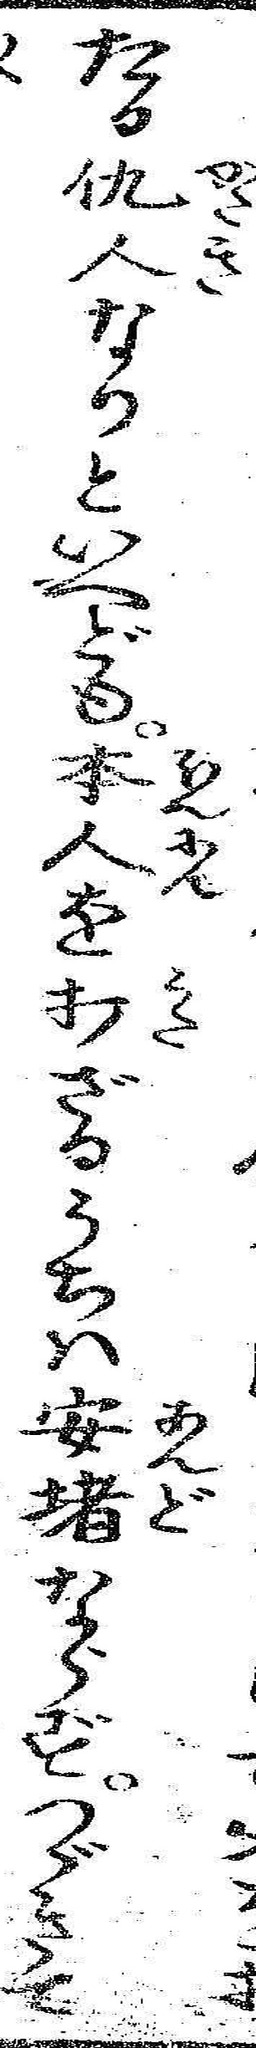たる仇人なりといへども。本人を打ざるうちは安堵ならず。つゞきて
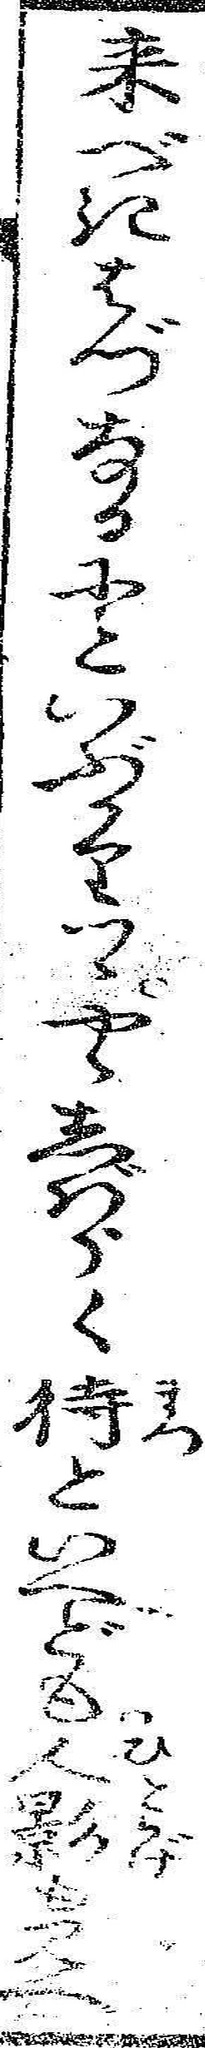来べきはづなるにといぶかりつゝ。やゝしばらく待といへども。人影も見へ

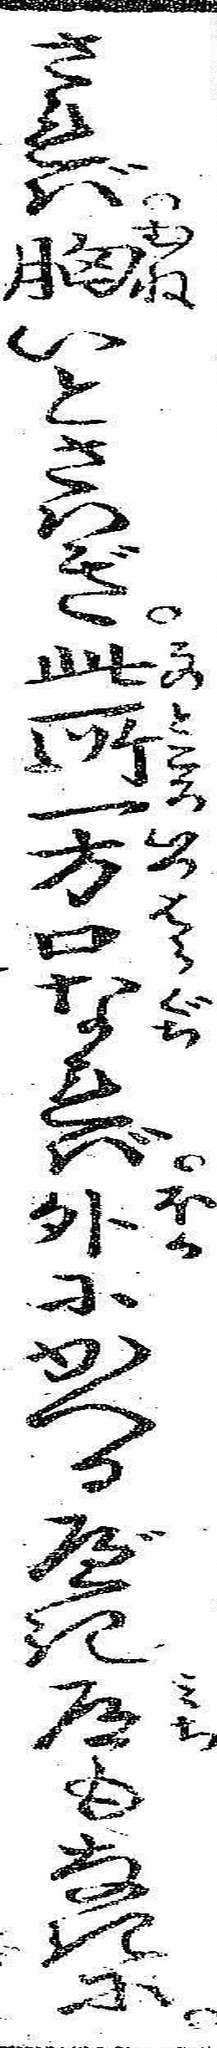されば。胸いとさはぎ。此所一方口なれば。外にかへるべき道もなきに。
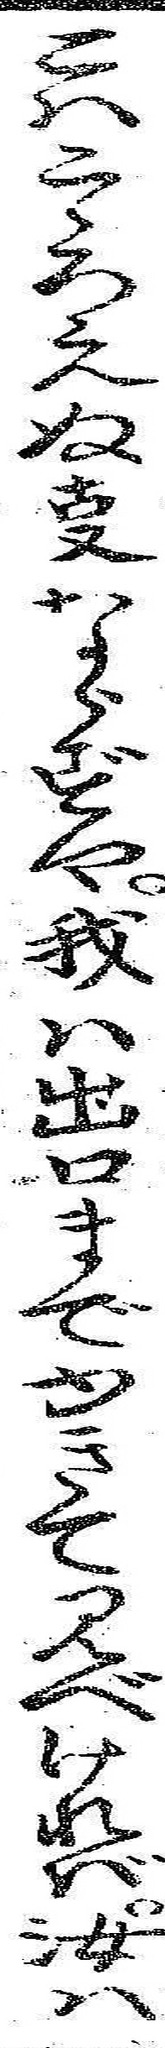こはこゝろえぬ事ならずや。我は出口までゆきて見べければ。汝は
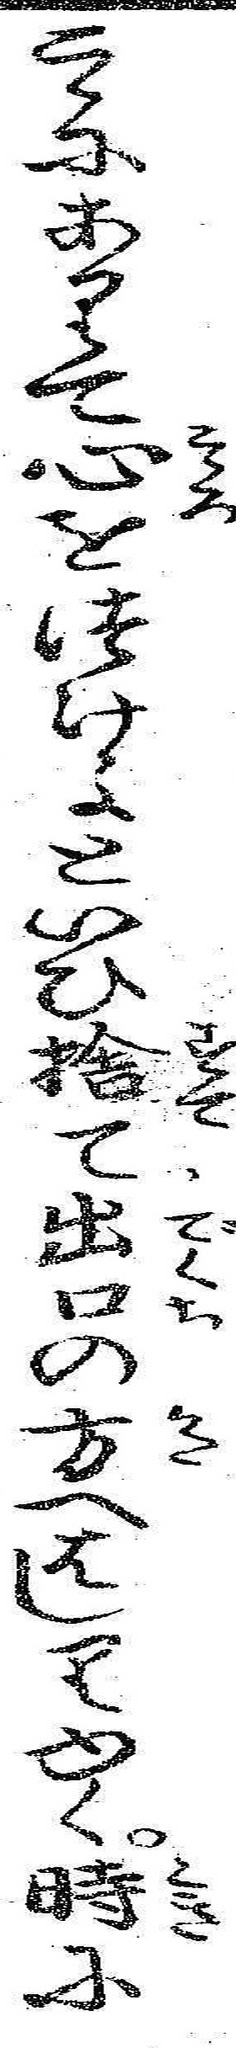こゝにありて心をつけよといひ捨て。出口の方へはしりゆく。時に
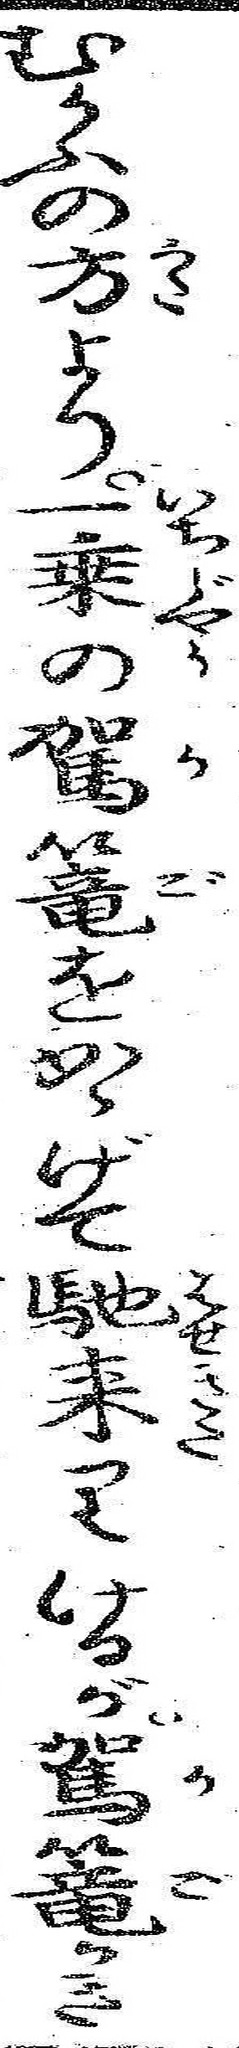むかふの方より。一乗の駕篭をかゝげて馳来りけるが。駕篭かき
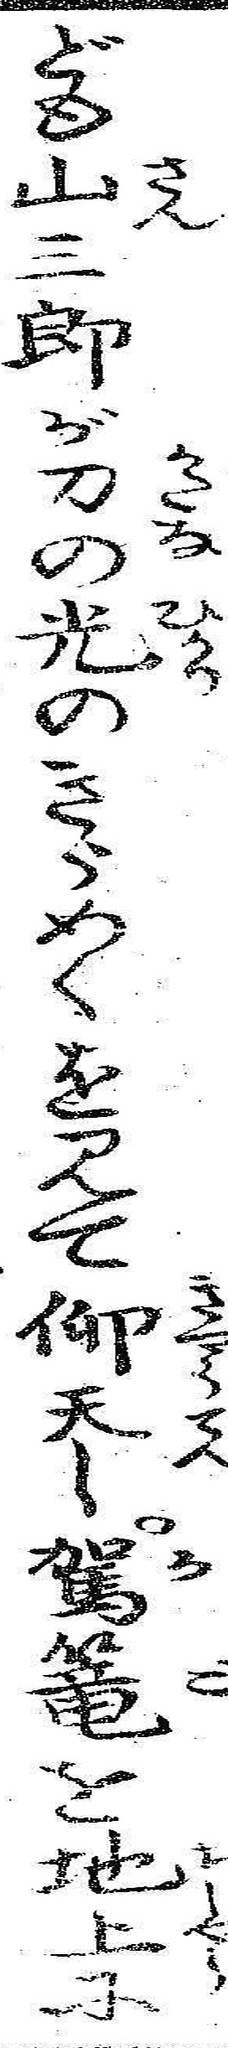ども山三郎が刀の光のきらめくを見て仰天し。駕篭を地上に
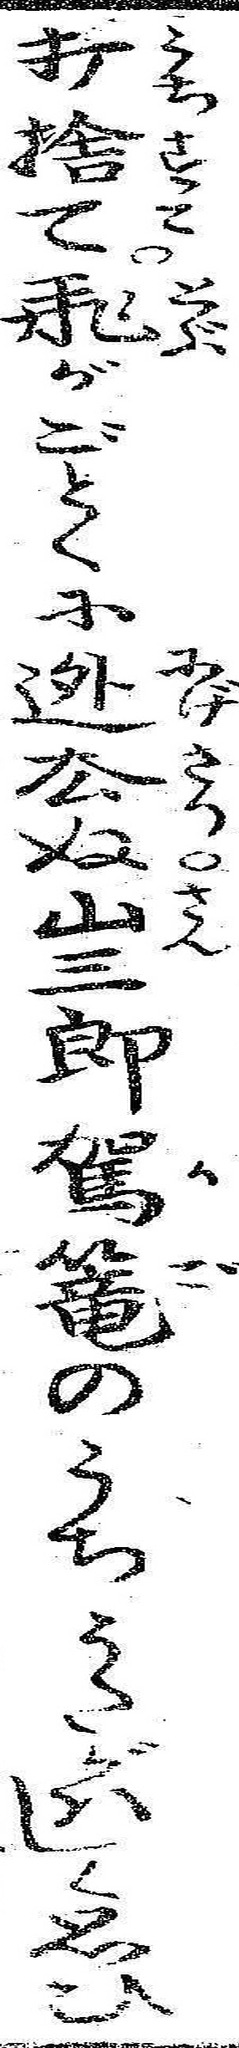打捨て。飛がごとくに逃去ぬ。山三郎駕篭のうちうたがはしく思ひ
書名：昔話稲妻表紙
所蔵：国文学研究資料館
